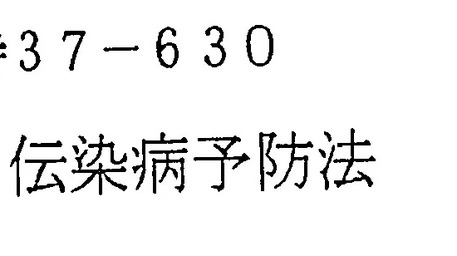伝染病予防法
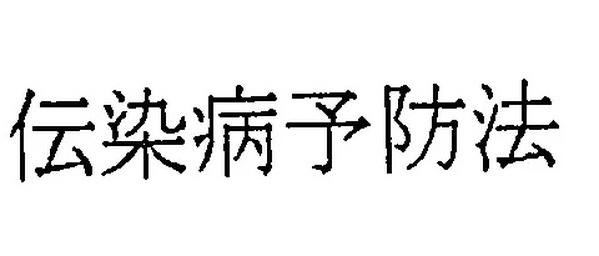伝染病予防法
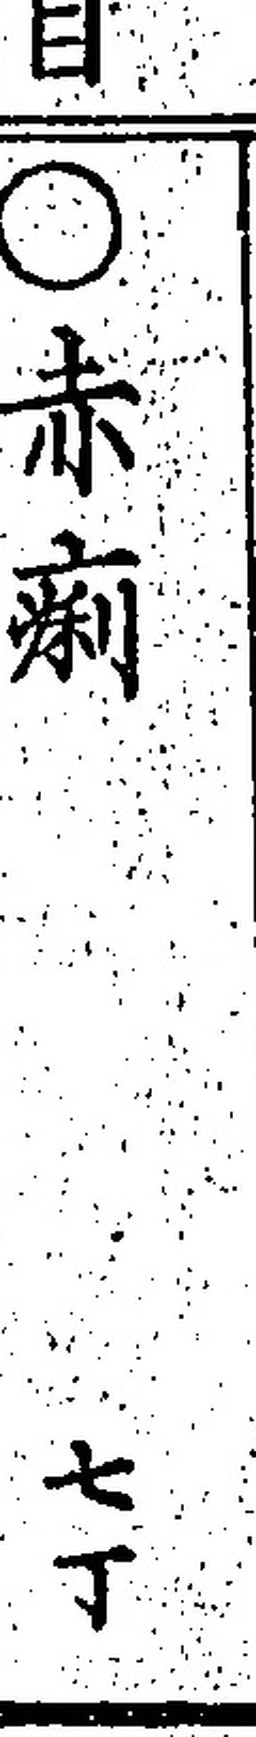○赤痢七丁
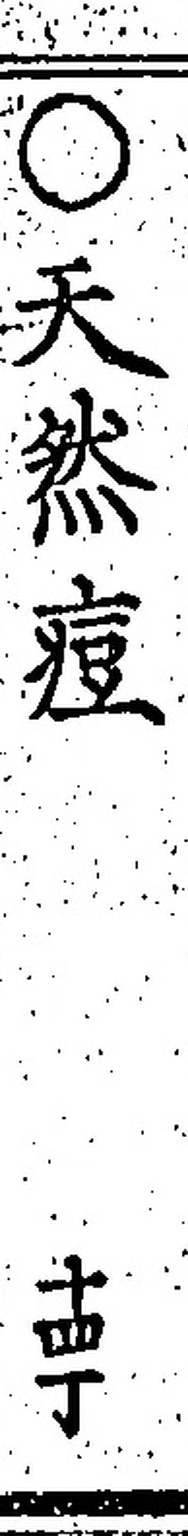○天然痘十四丁
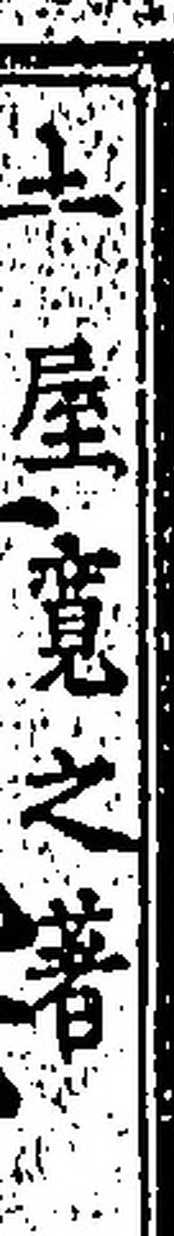土屋寛之著

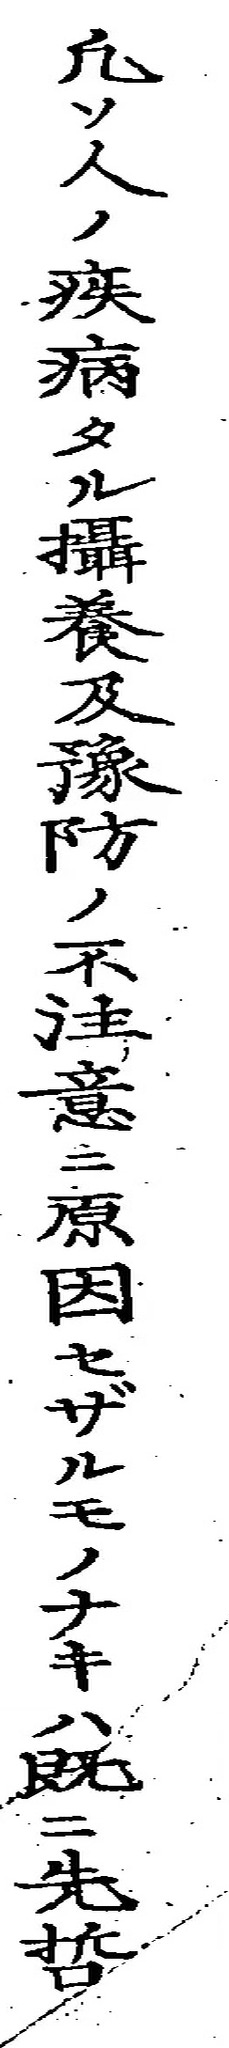凡ソ人ノ疾病タル摂養及予防ノ不注意ニ原因セザルモノナキハ既ニ先哲
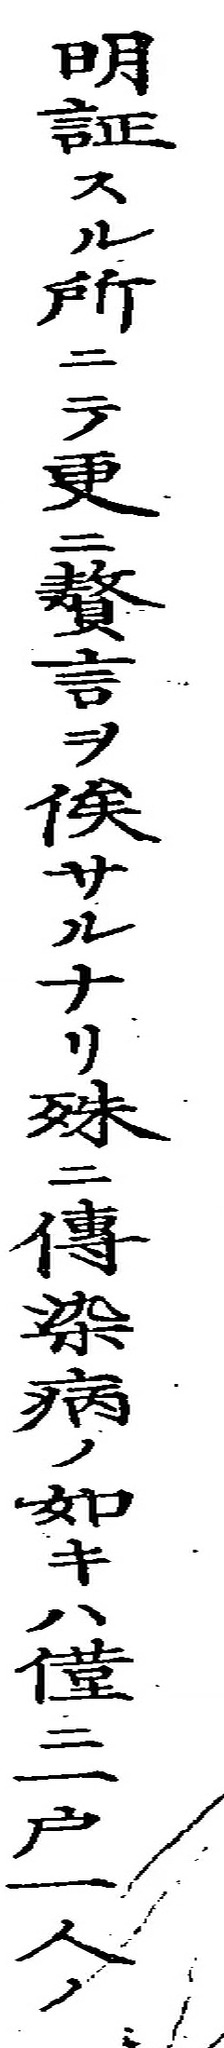明証スル所ニテ更ニ贅言ヲ俟サルナリ殊ニ伝染病ノ如キハ僅ニ一戸一人ノ
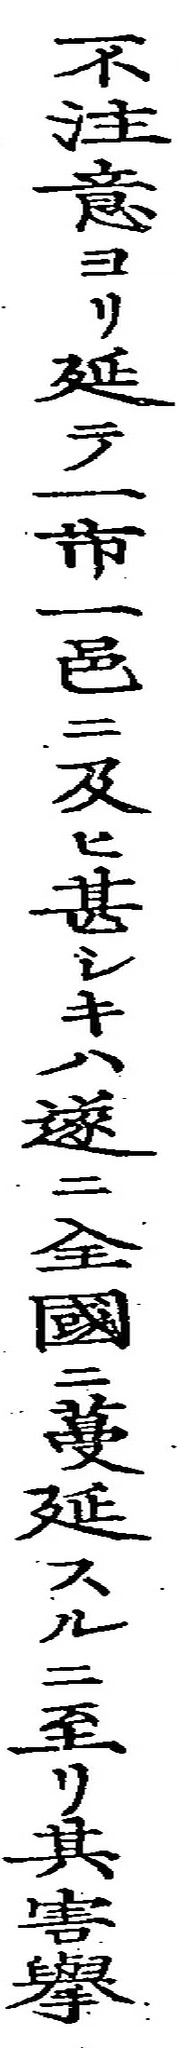不注意ヨリ延テ一市一邑ニ及ヒ甚シキハ遂ニ全国ニ蔓延スルニ至リ其害挙
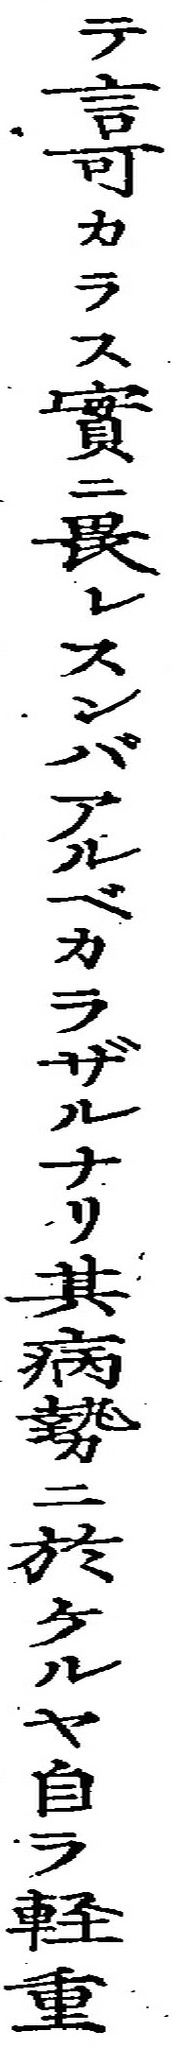テ言可カラス実ニ畏レスンバアルベカラザルナリ其病勢ニ於ケルヤ自ラ軽重
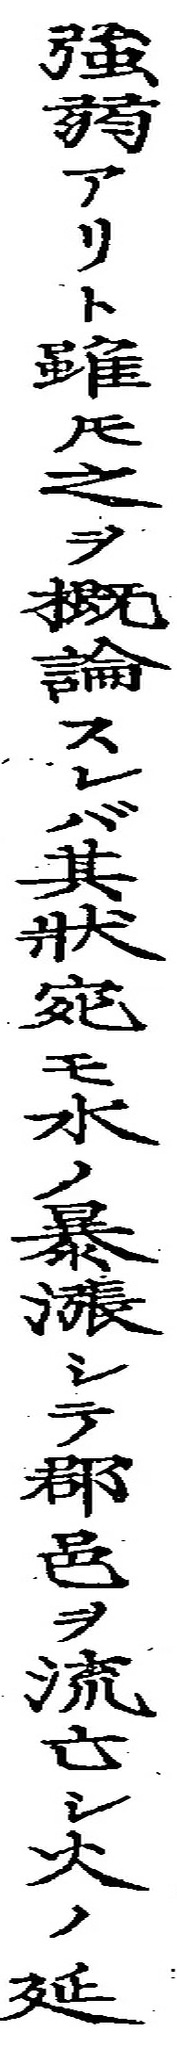強弱アリト雖トモ之ヲ概論スレバ其状宛モ水ノ暴漲シテ群邑ヲ流亡シ火ノ延
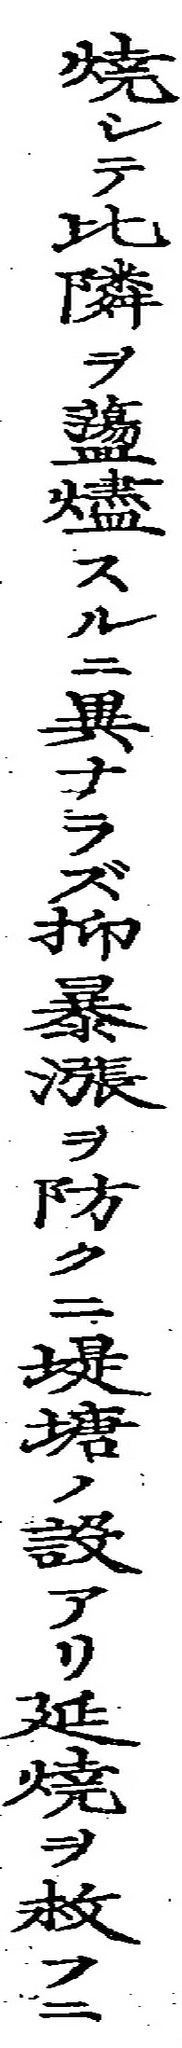焼シテ比隣ヲ蘯燼スルニ異ナラズ抑暴漲ヲ防クニ堤塘ノ設アリ延焼ヲ救フニ
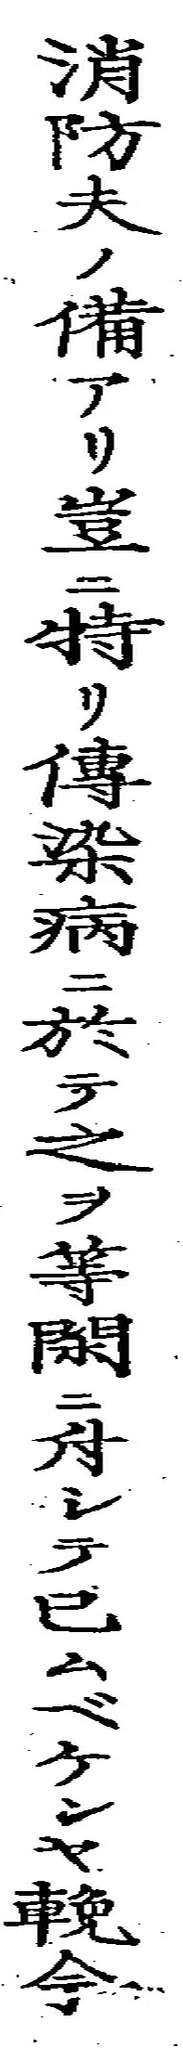消防夫ノ備アリ豈ニ特リ伝染病ニ於テ之ヲ等閑ニ付シテ已ムベケンヤ輓今
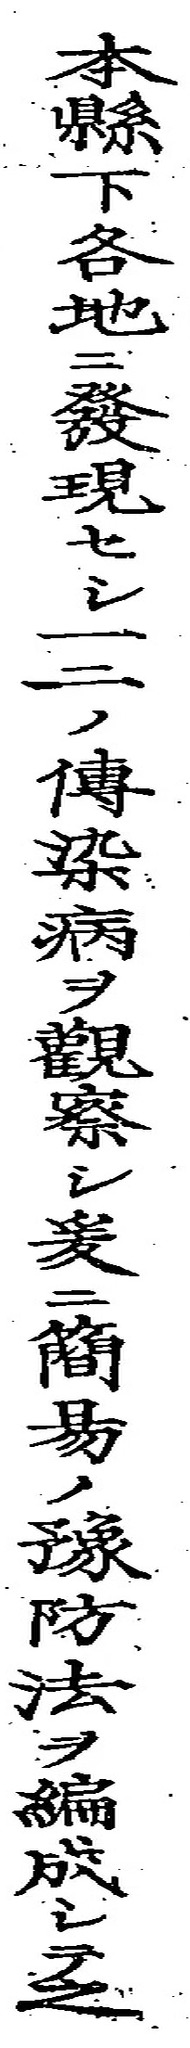本県下各地ニ発現セシ一二ノ伝染病ヲ觀察シ爰ニ簡易ノ予防法ヲ編成シテ之
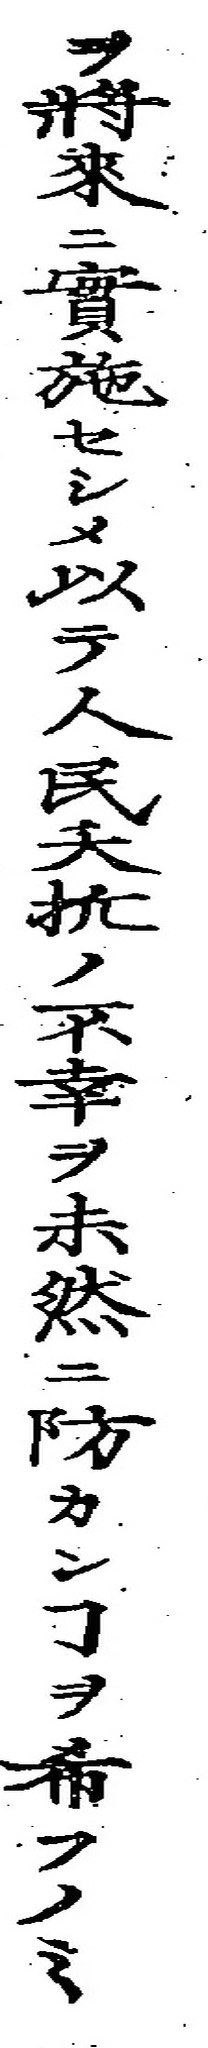ヲ将来ニ実施セシメ以テ人民夭折ノ不幸ヲ未然ニ防カンコトヲ希フノミ
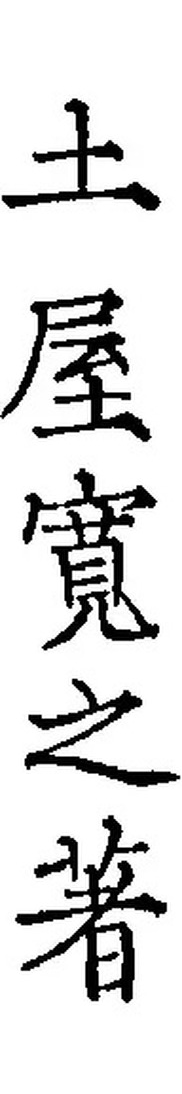土屋寛之著
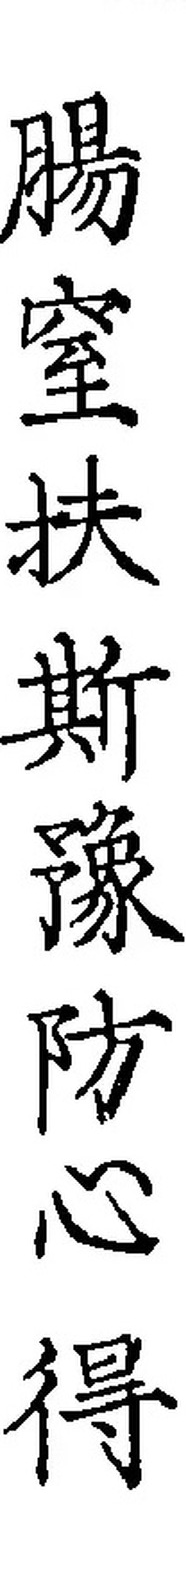膓窒扶斯予防心得
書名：伝染病予防法
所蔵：国立国会図書館 National Diet Library, JAPAN
